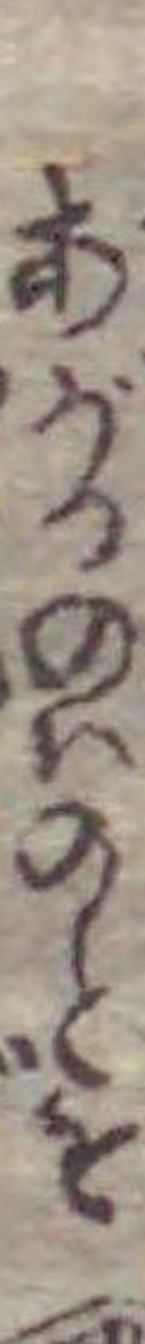あがるのはのとを
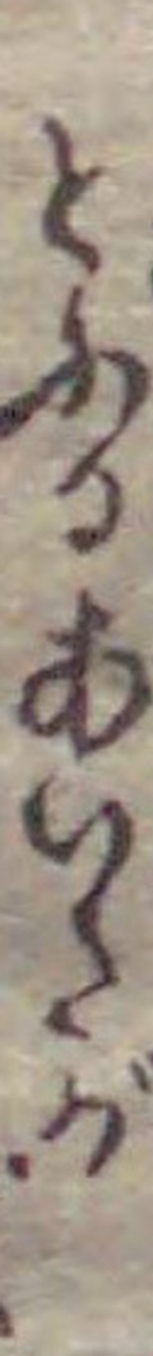とふるあいだが
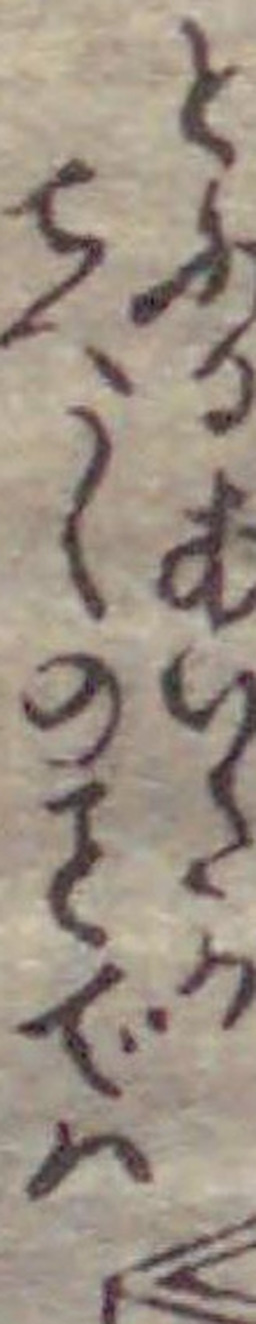てへしのことでは
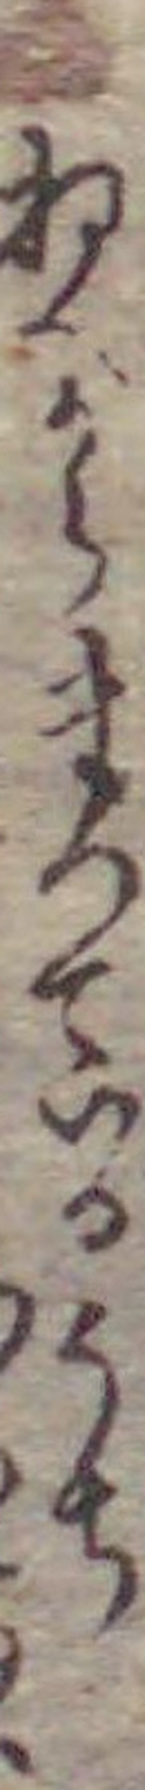ねへからまつているうち
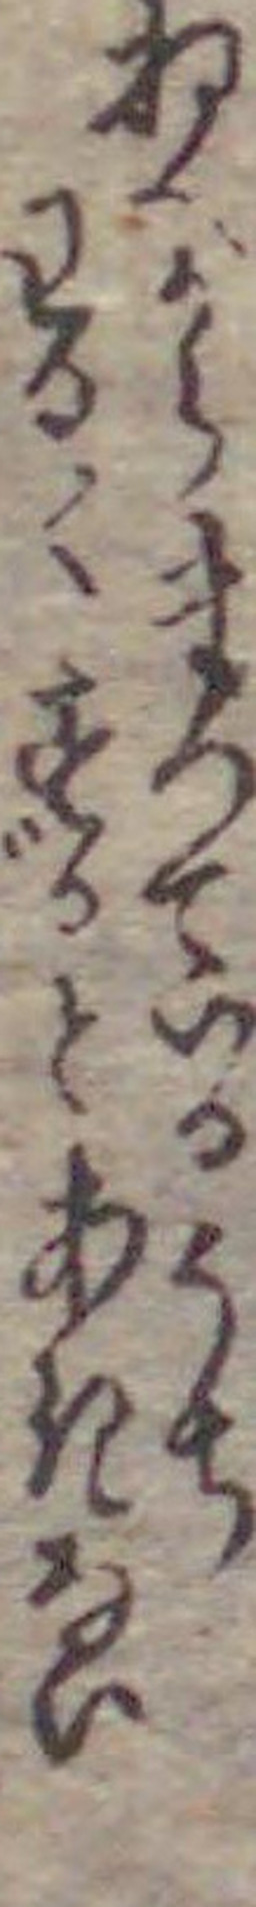わるくするとあきない
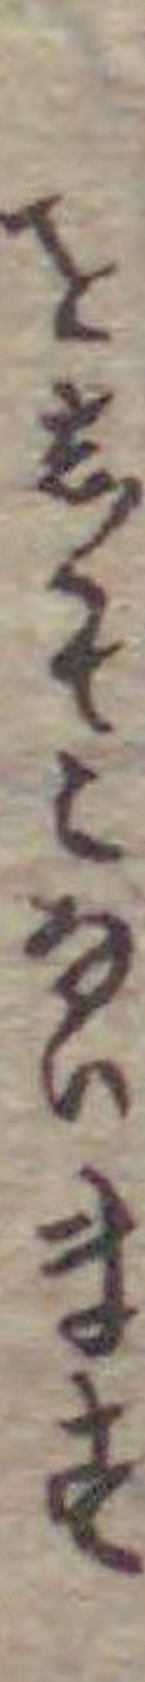をしぞこないます

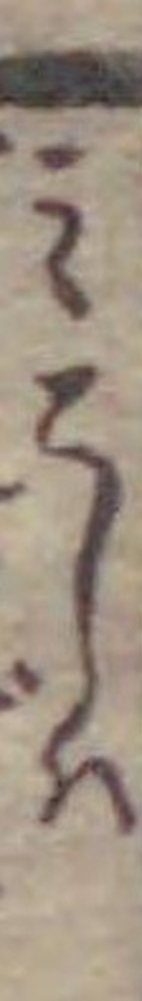みこしは
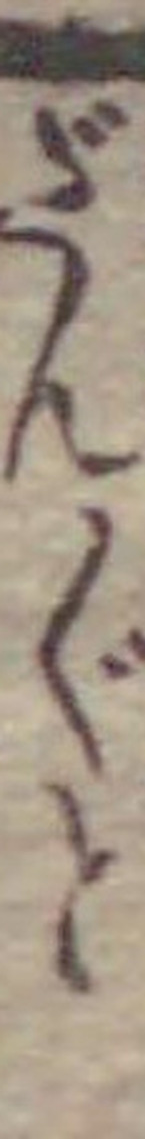だん〴〵と
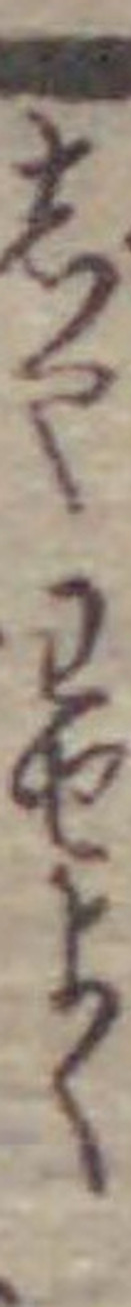しやわせよく
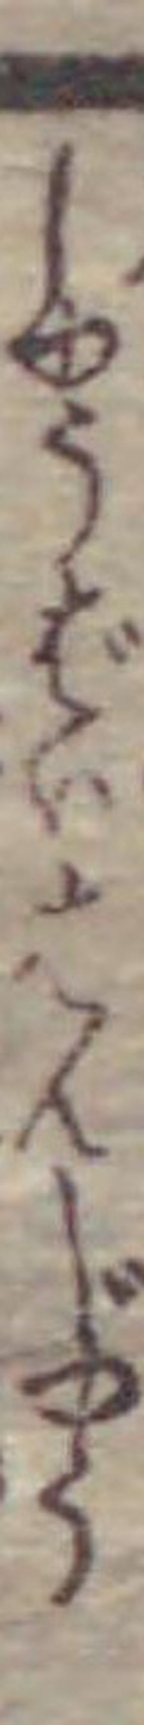しやうばいはんじやう
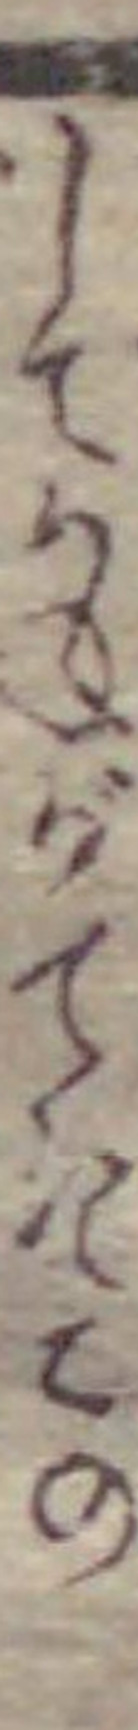いてかねがてきてこの
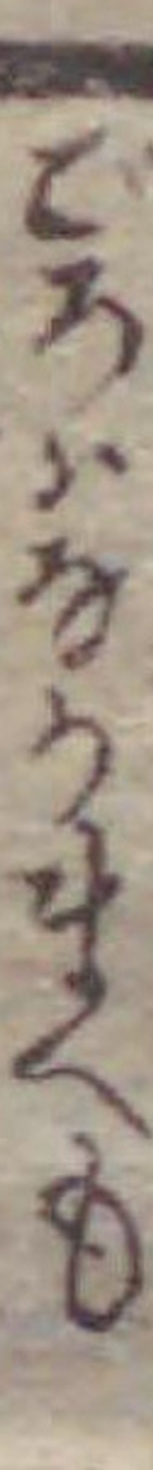ごろはなかまへも
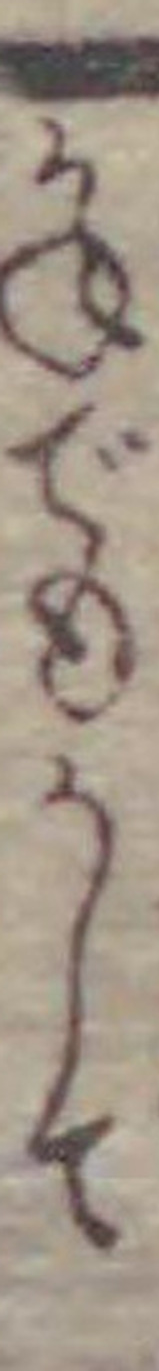かねでもかして
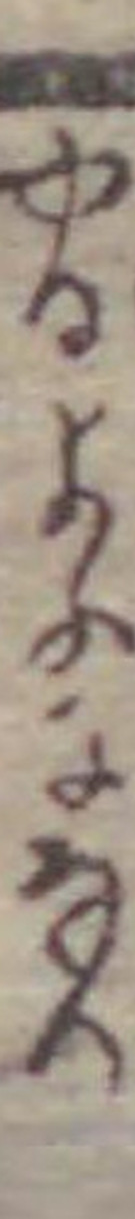やるよふになり
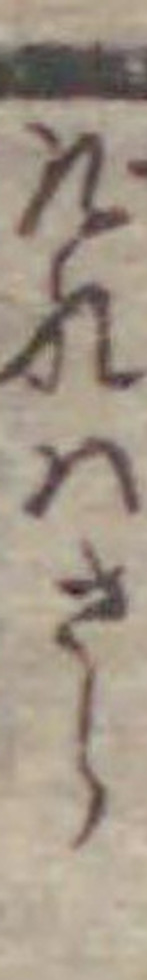けれはさら
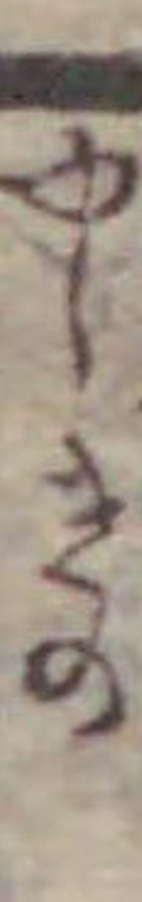やしきの
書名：化物見世開 : 2巻
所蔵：国立国会図書館 National Diet Library, JAPAN
